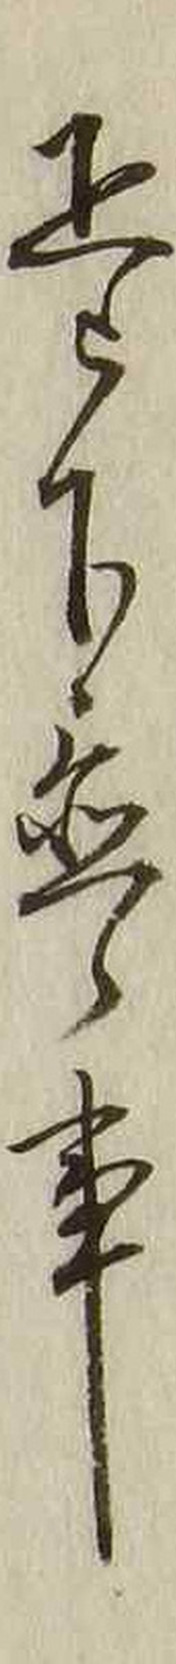疋被下置候事
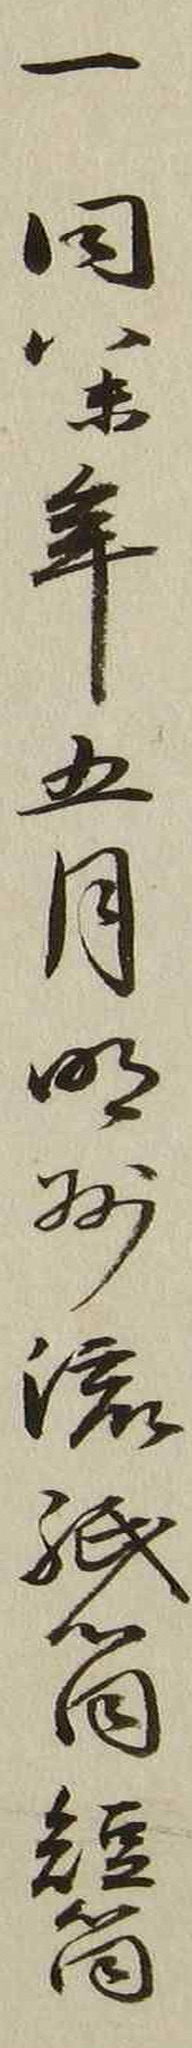一同八未年五月明州流紙筒短筒
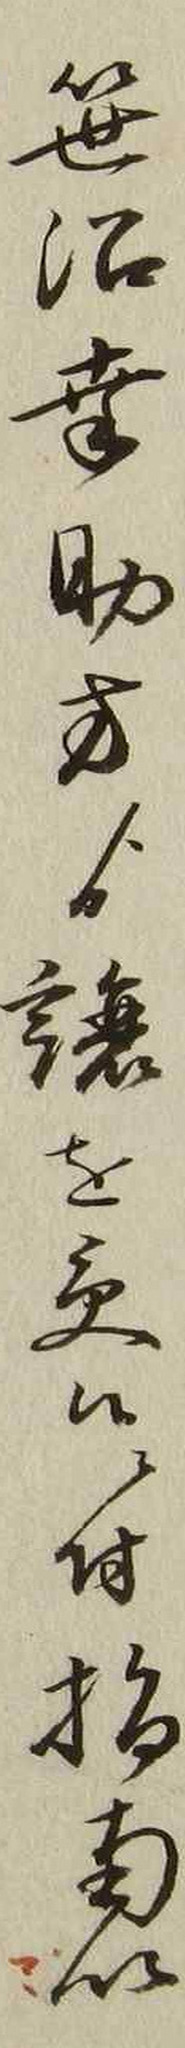笹沼幸助方ゟ譲を受候付指南以
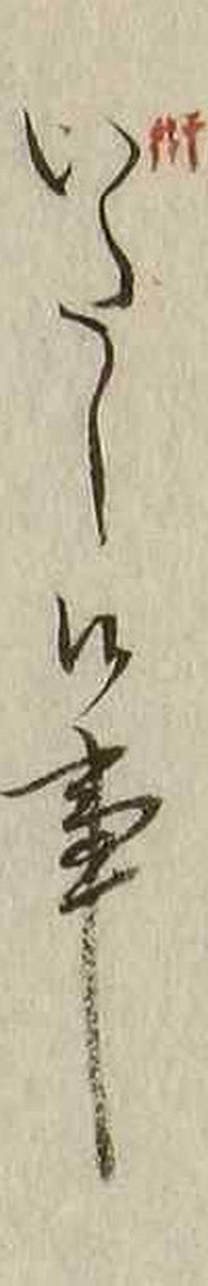いたし候事
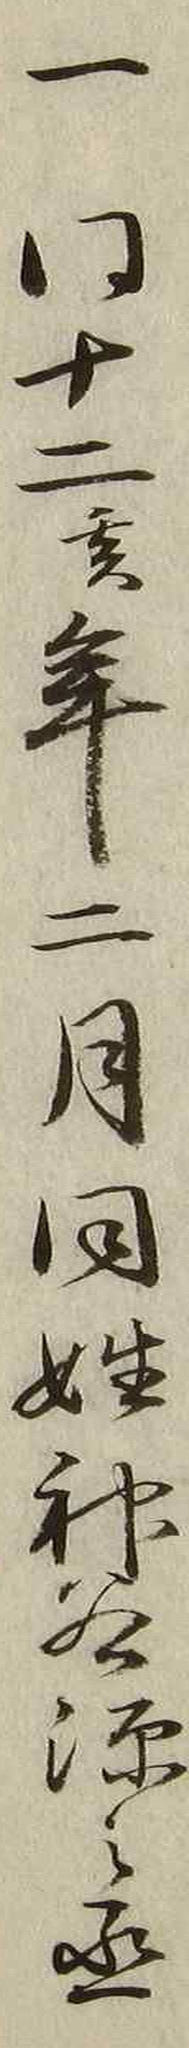一同十二亥年二月同姓神谷源之丞
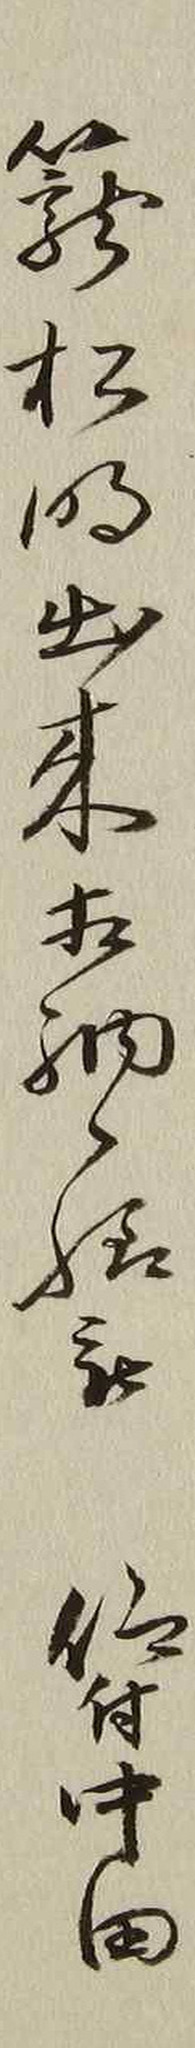籠松明出来相納候様被仰付中田
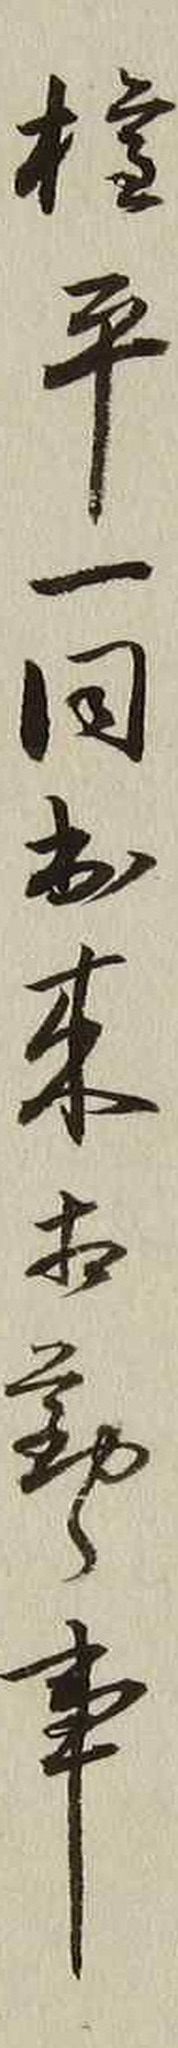權平一同出来相勤候事
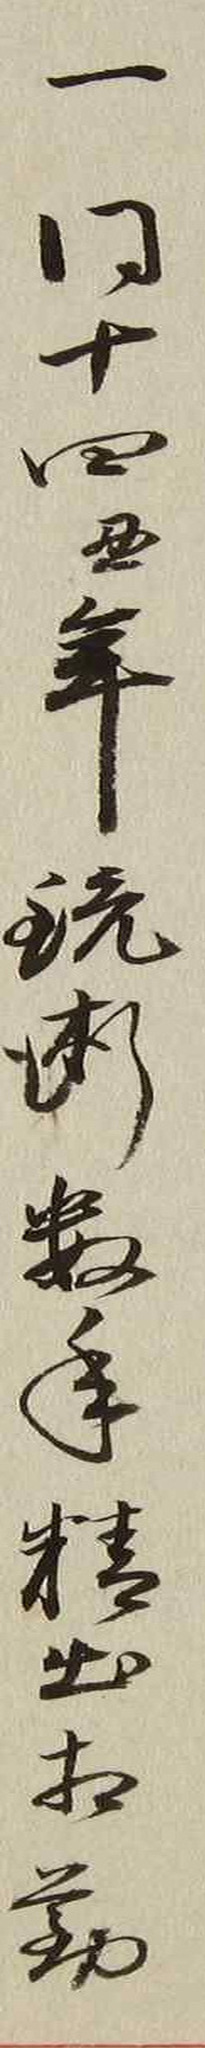一同十四丑年銃術数年精出相勤
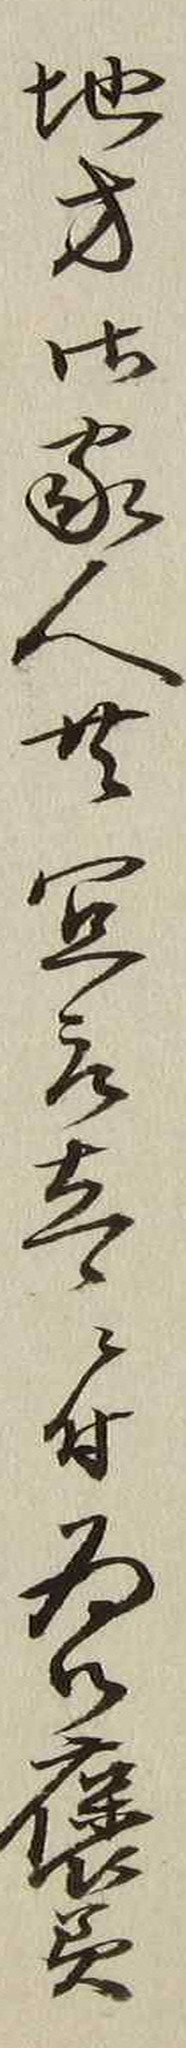地方御家人共宜取立候付為御褒美
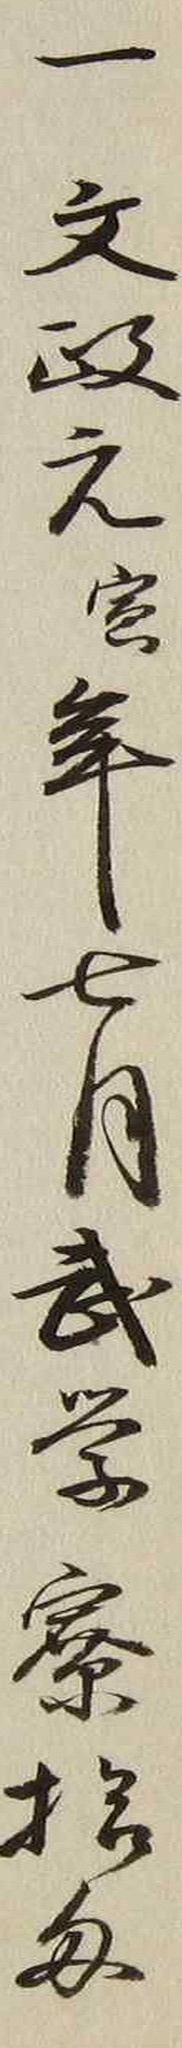一文政元寅年七月武学寮拾匁
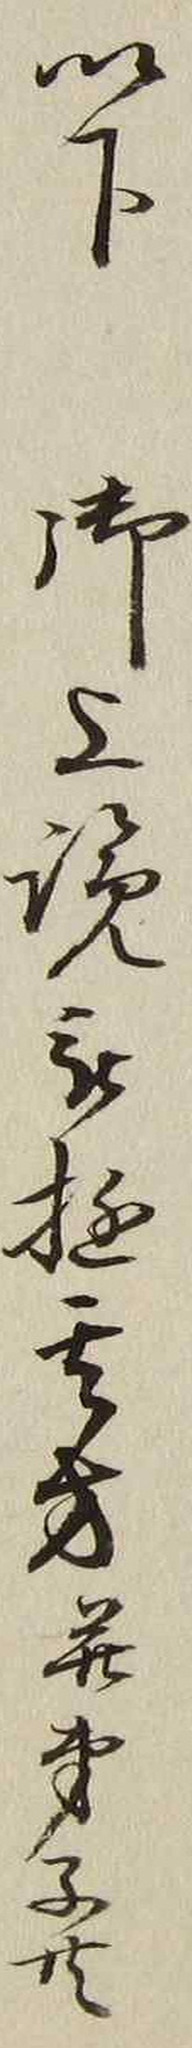以下御上覧被極其方并弟子共
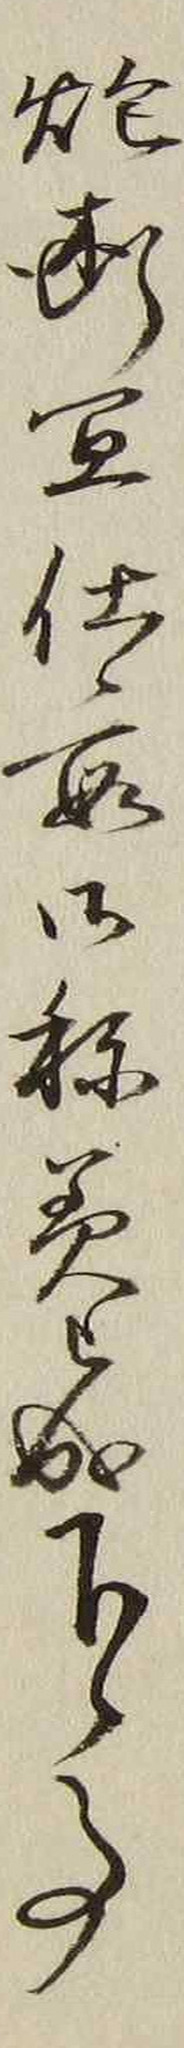炮術宜仕段所御称美被成下候事
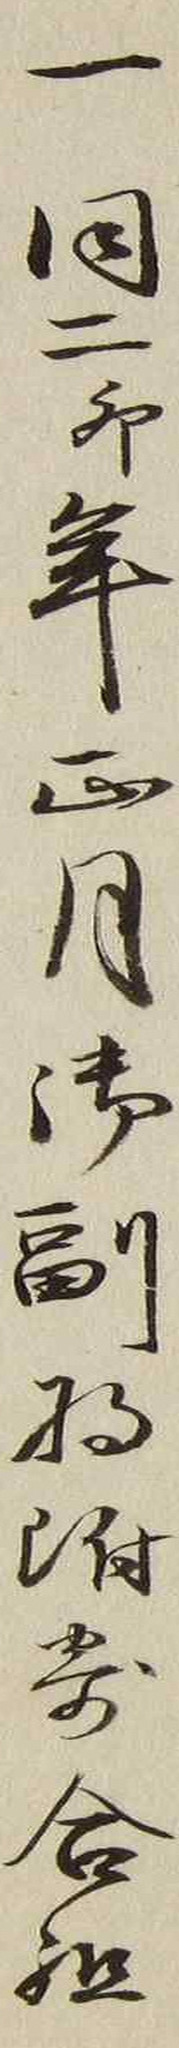一同二卯年正月御副将附寄合組
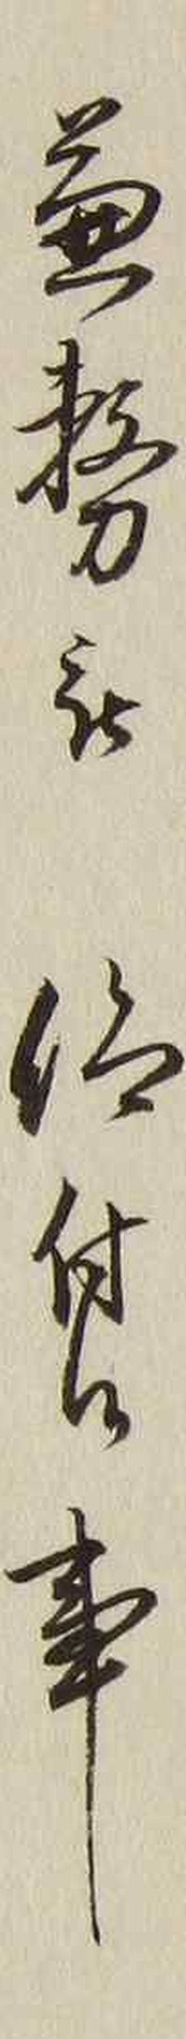兼務被仰付候事
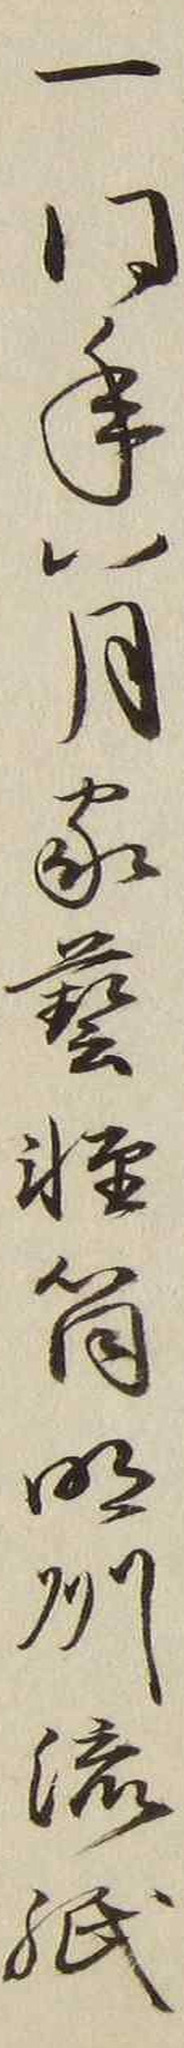一同年八月家芸軽筒明州流紙

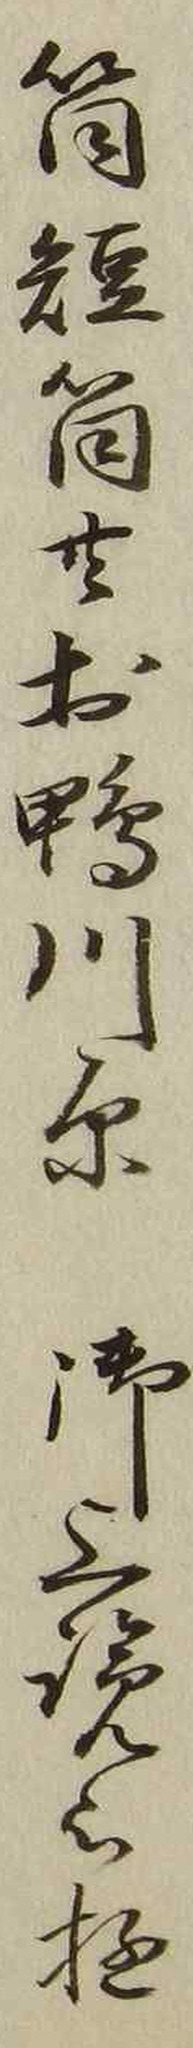筒短筒共於鴨川原御上覧被遊
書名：諸士系譜　巻之102　か之部10
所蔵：会津若松市立会津図書館
